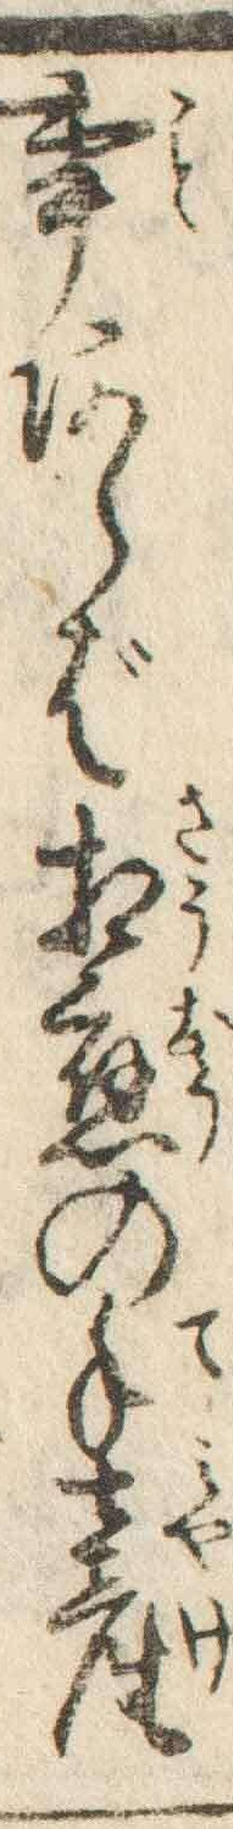事あらば相応の手土産
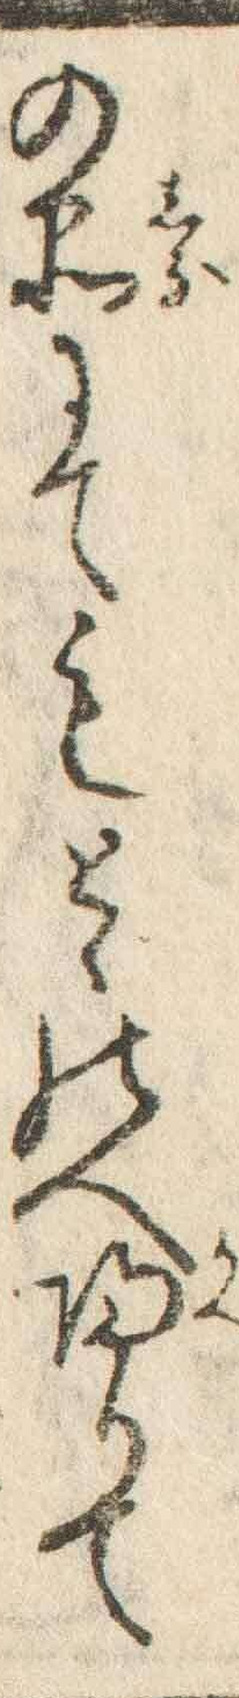の品にてもとゝのへ帰りて
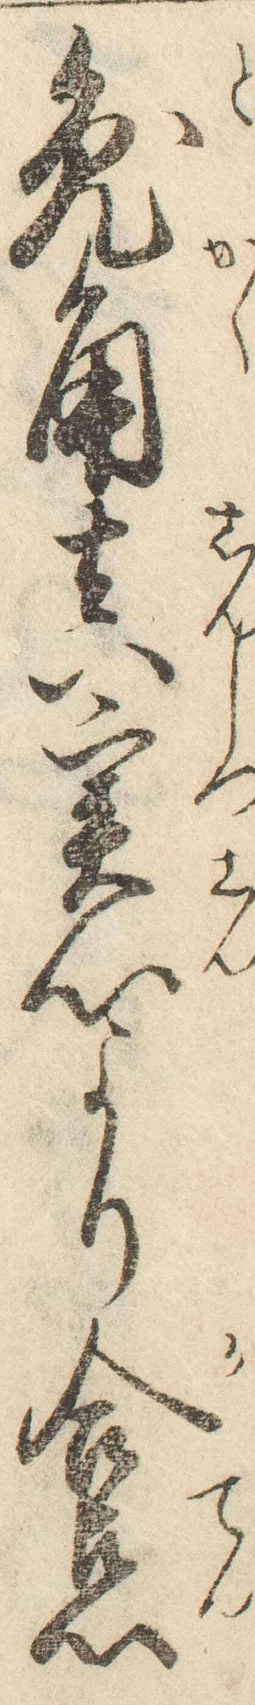兎角真実心より合点
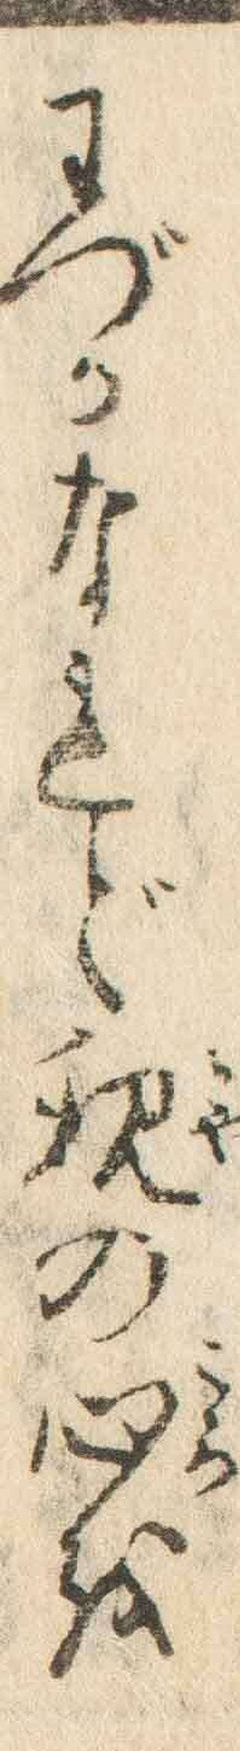わづかなれど親の心を
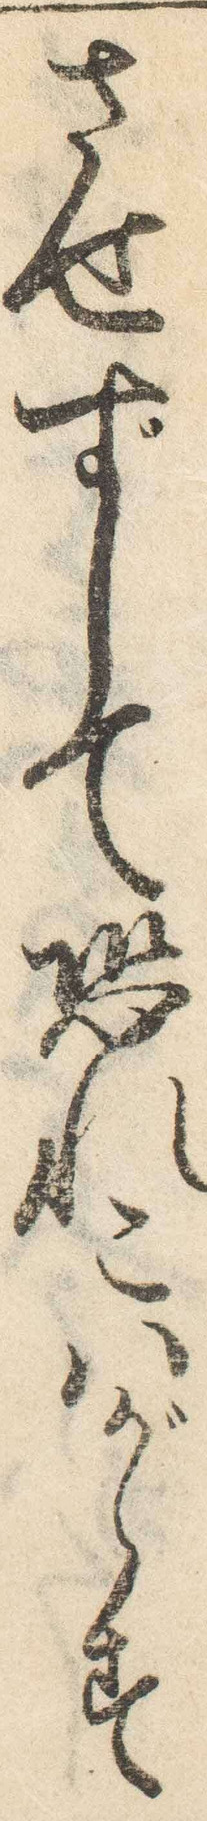させずして恐れこはがらす
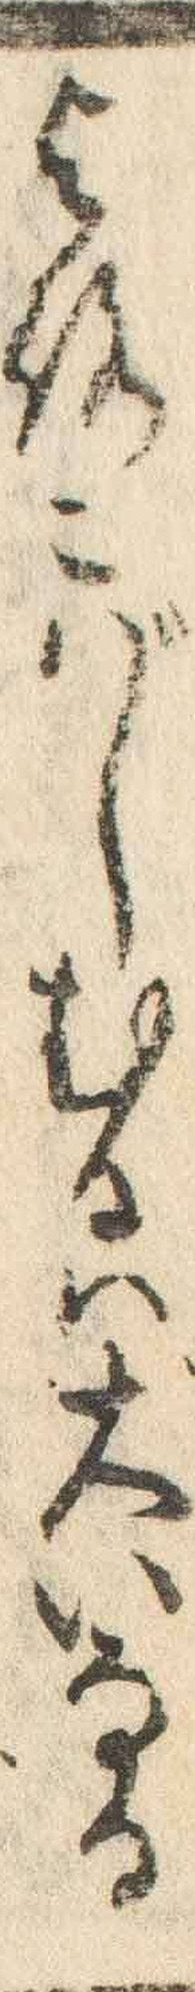よろこばしむるは大いなる
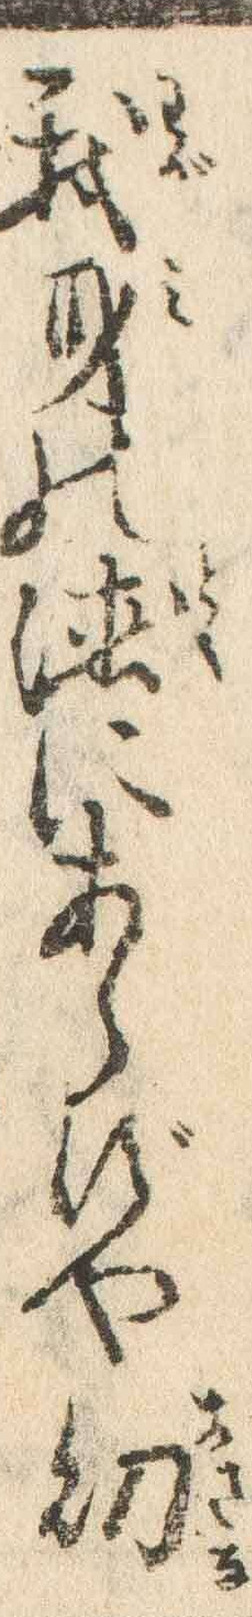我身の徳にあらずや幼
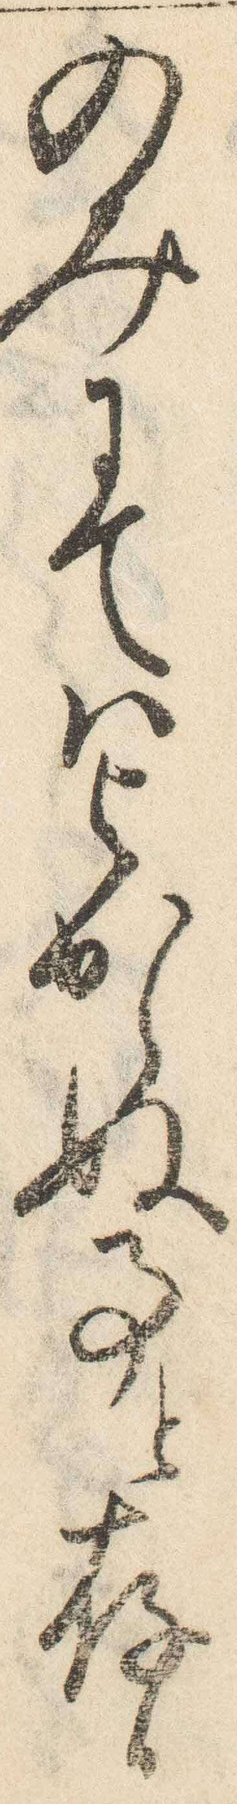のみにてはよからぬ事と存候
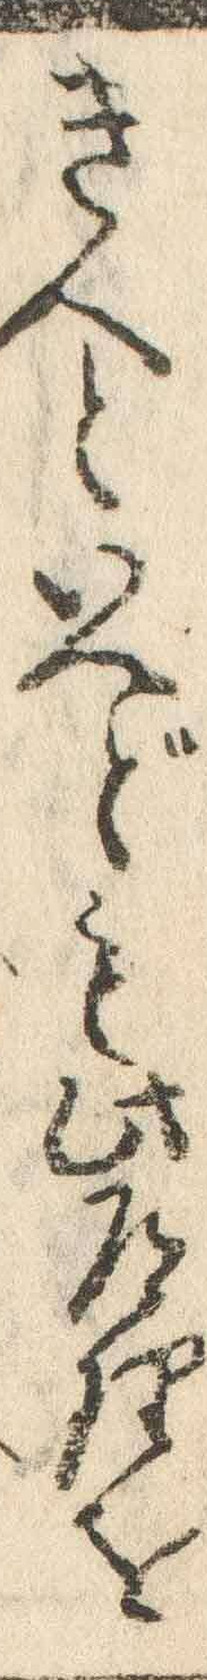き人といへども此道理を
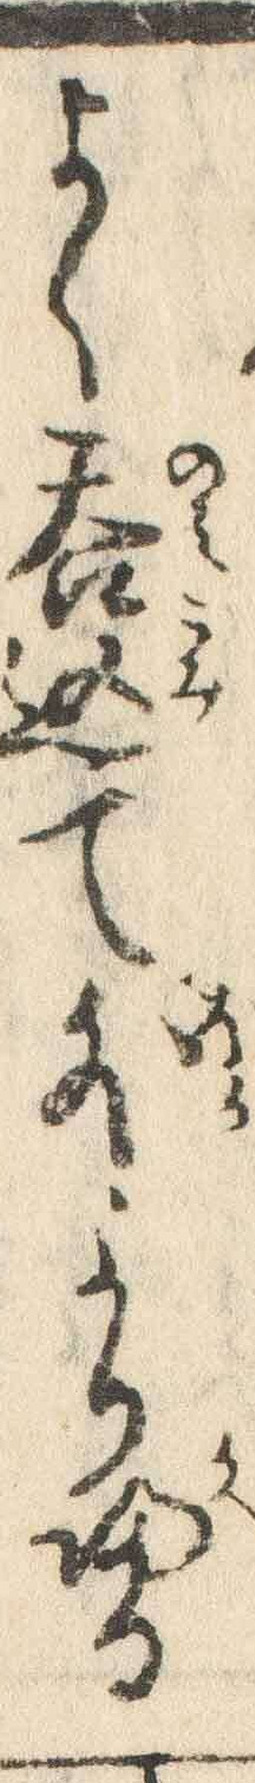よく呑込て外より帰る
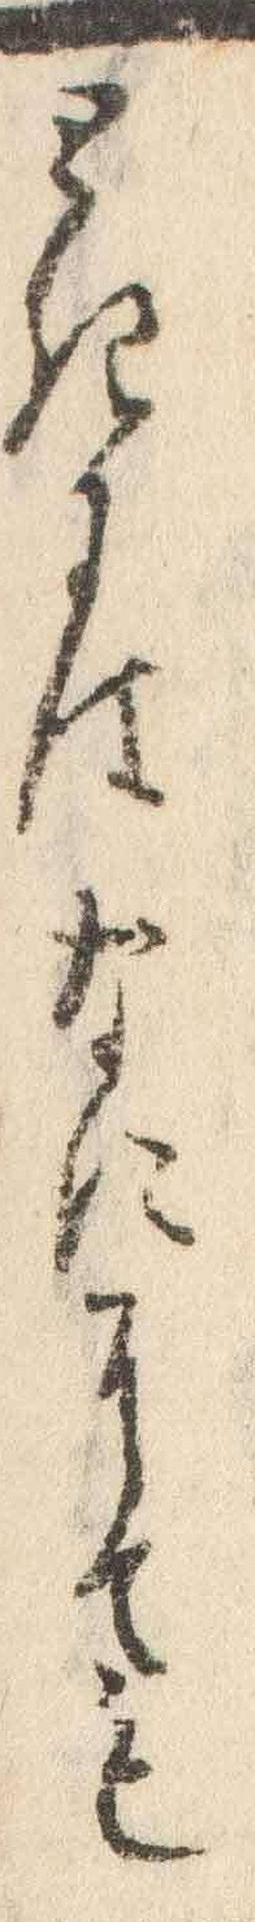ときにはなににても
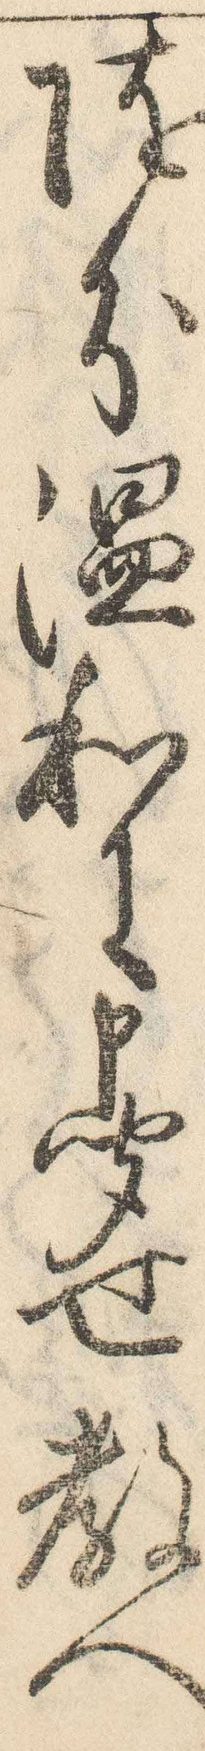随分温和に申聞せ教へ
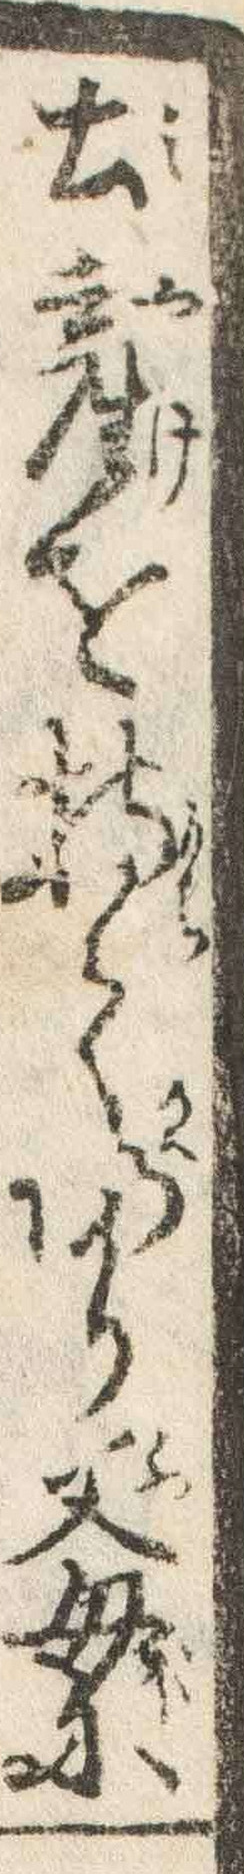土産を持て帰り父母に
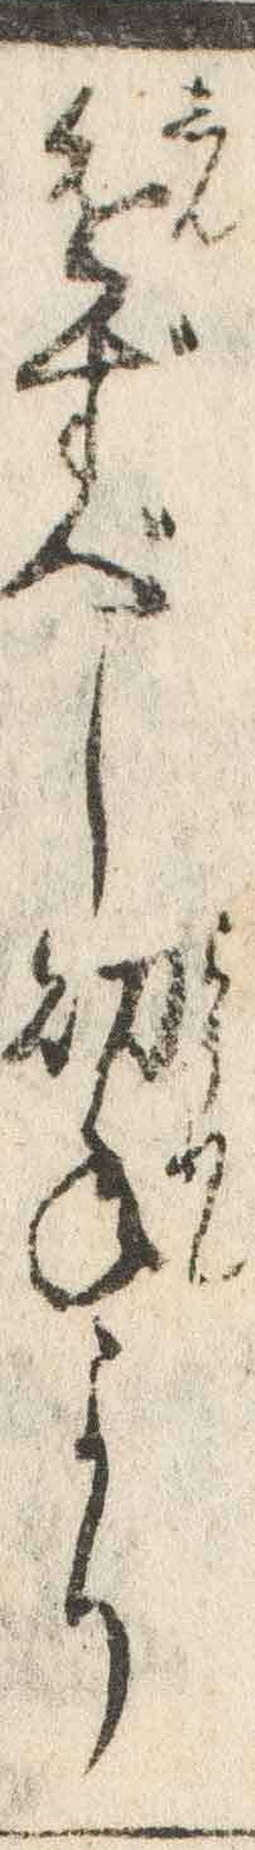進ずべし幼年より
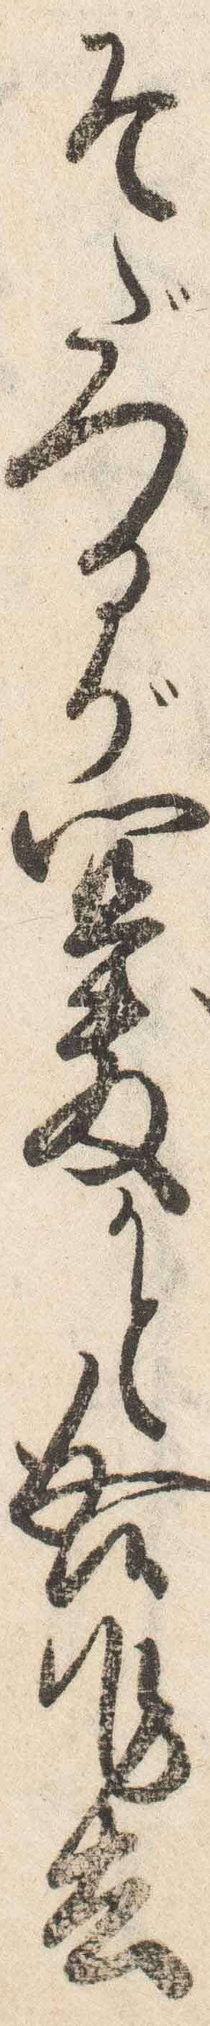そだつるが宜敷かと存候乍去
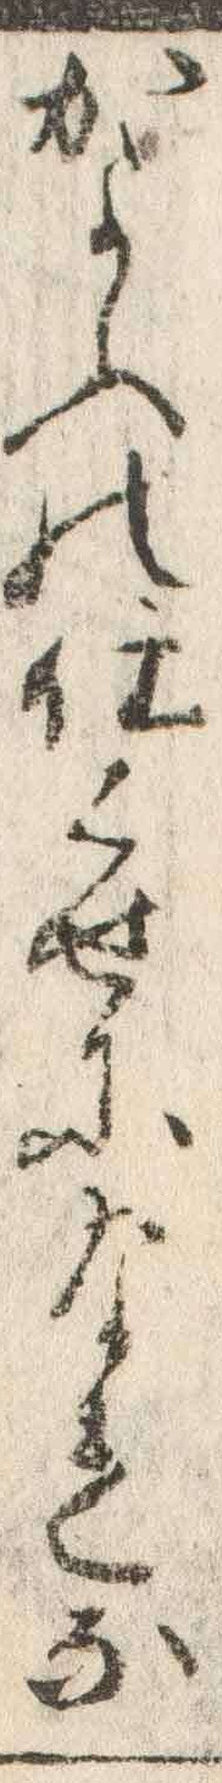かよふの仕くせになれな
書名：撫育草
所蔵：東京学芸大学附属図書館 国文学研究資料館
